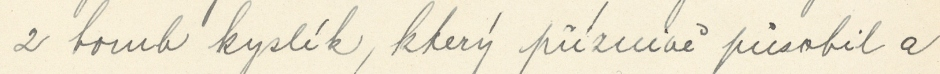z bomb kyslík, který příznivě působil a
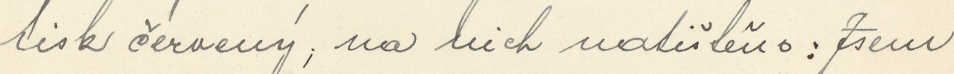tisk červený, na nich natištěno: Jsem
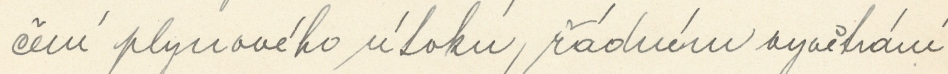čení plynového útoku, řádném vyvětrání
